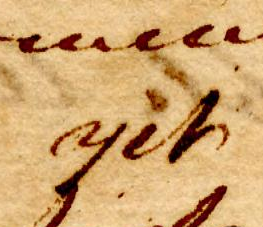yet
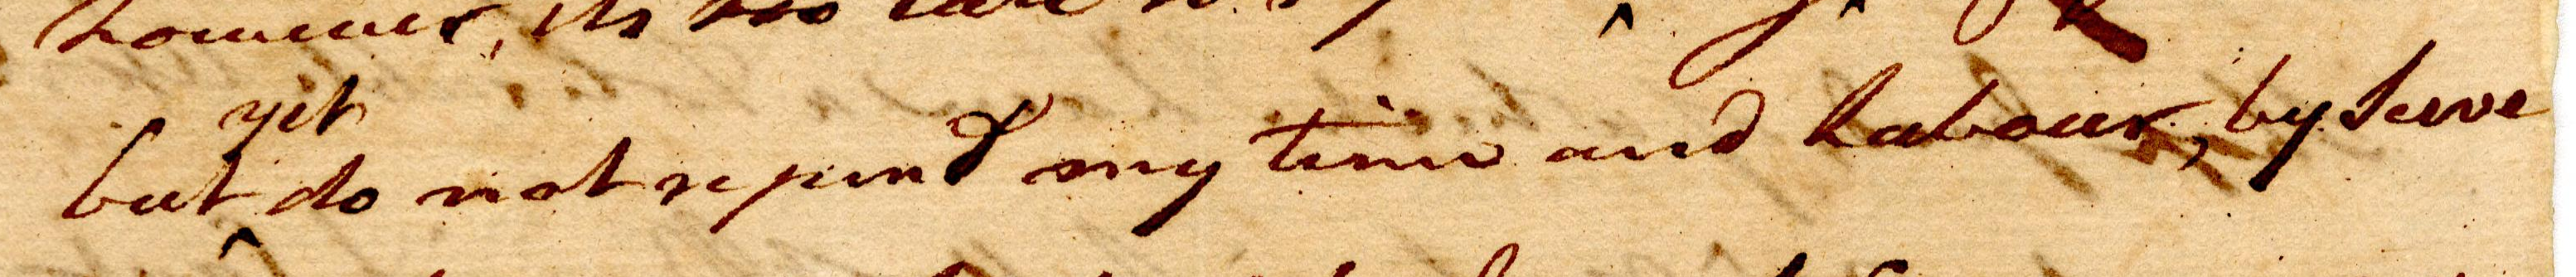but do not resent my time and Labour, by serve-
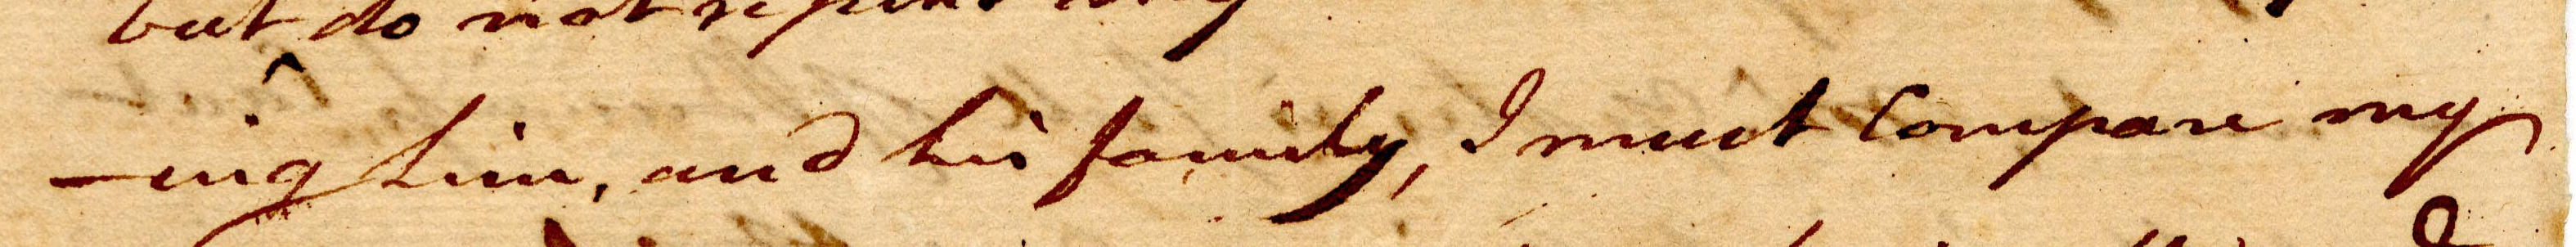-ing him, and his family, I must Compare my
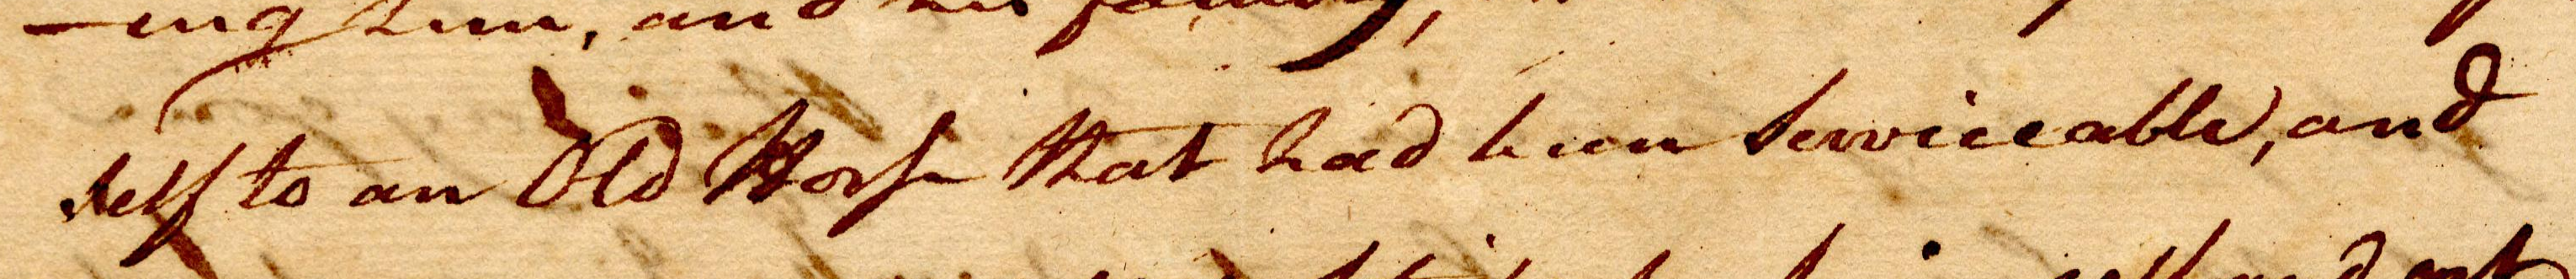self to an Old Horse that had been serviceable, and
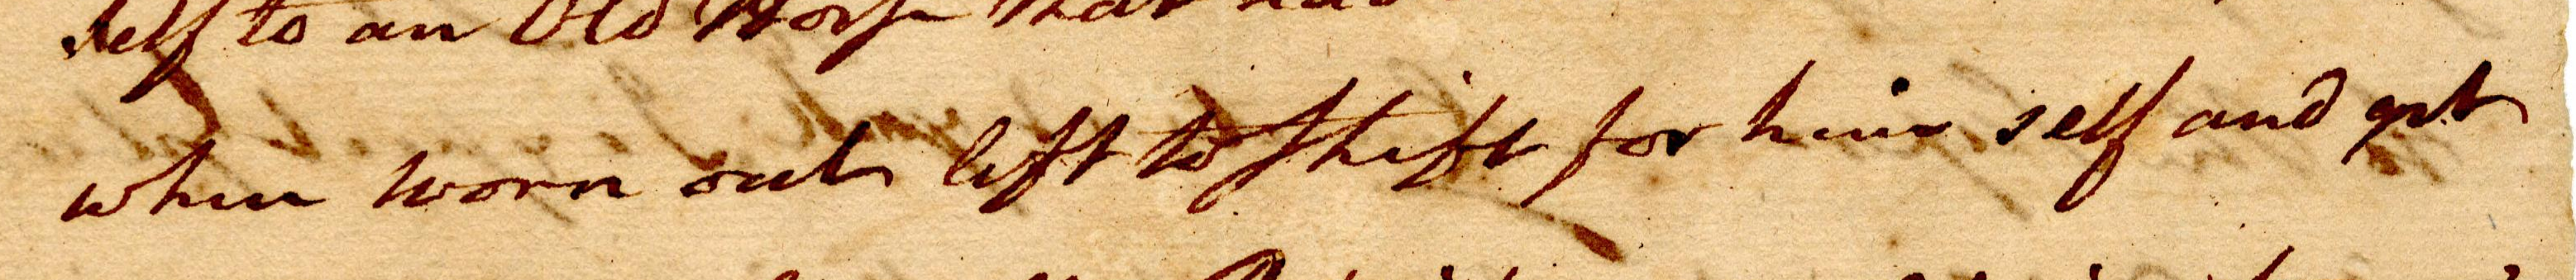where worn out left to shift for him self and get
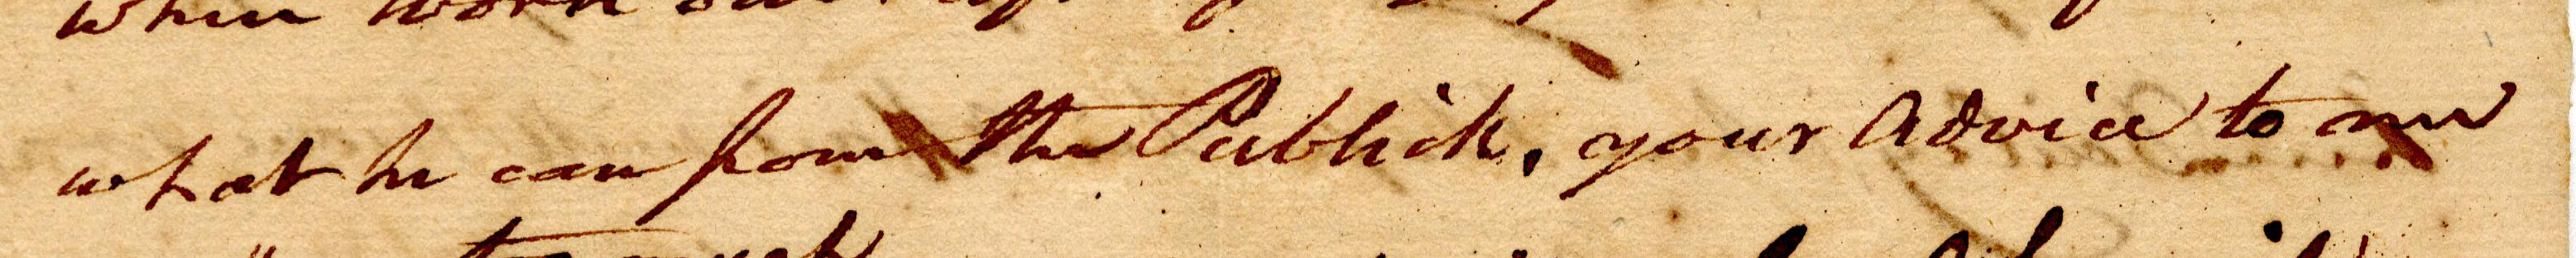what he can from the Publick, your Advice to now
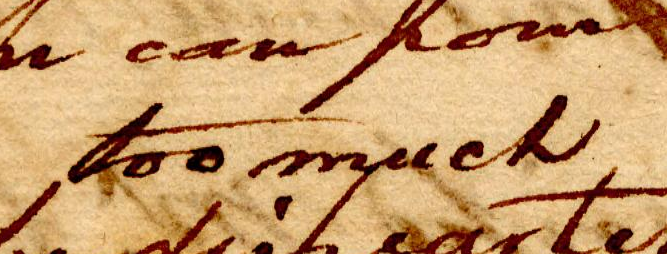too much
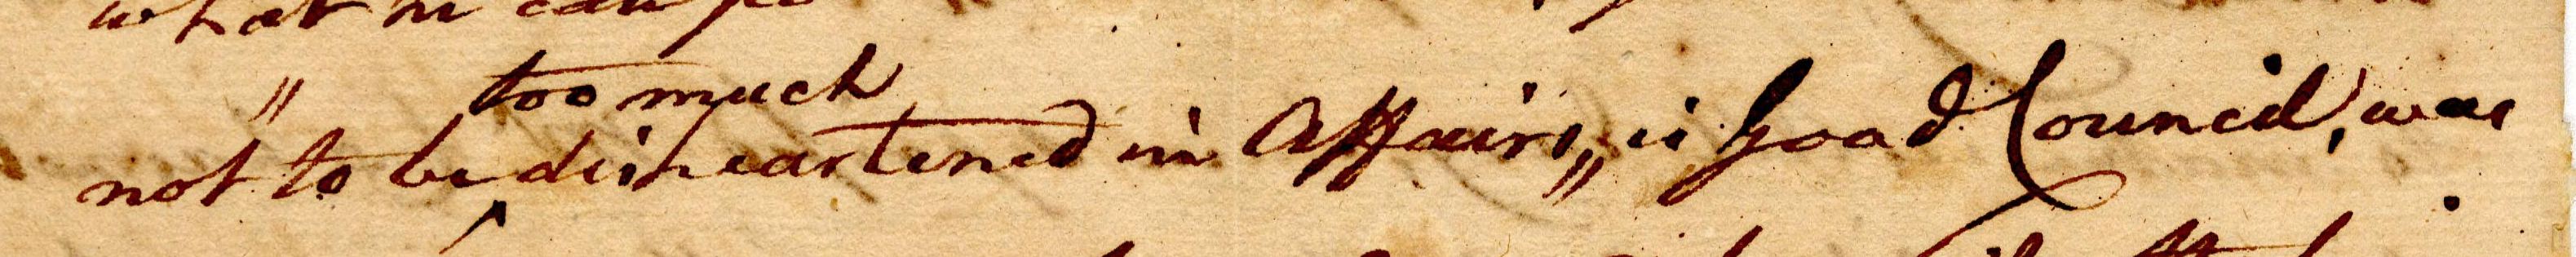not "to be ^ disheartened in Affairs" is good Council, was
